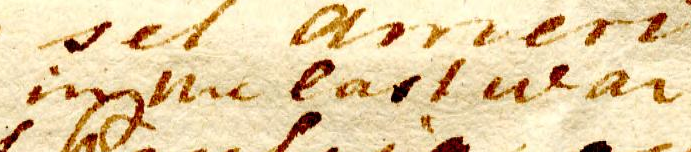in the last war
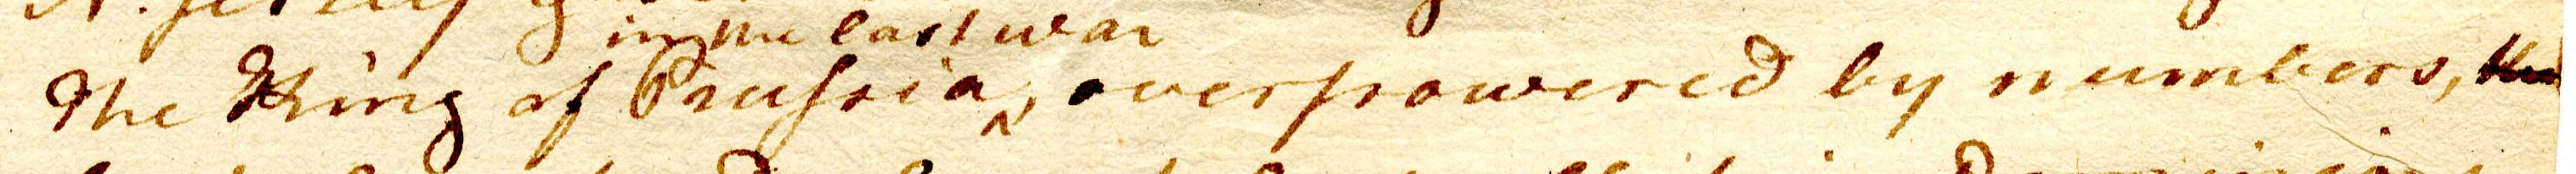The King of Prussia ^ , overpowered by numbers, [the]
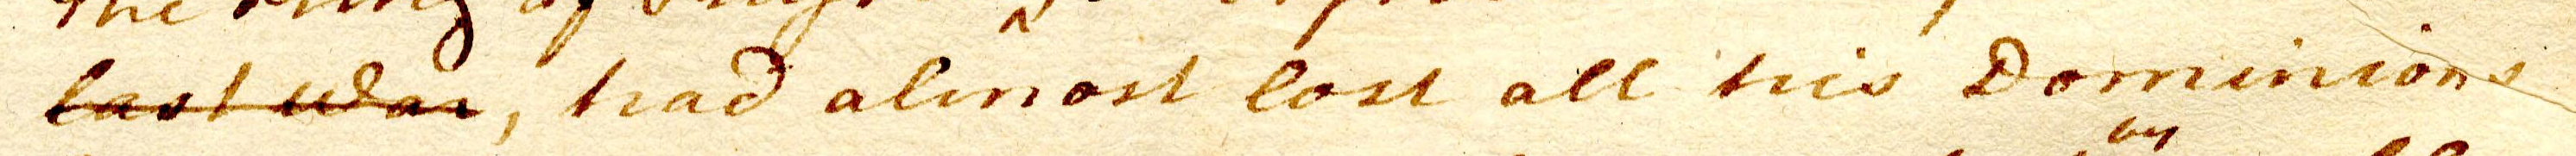[last war], had almost cost all tis Dominions
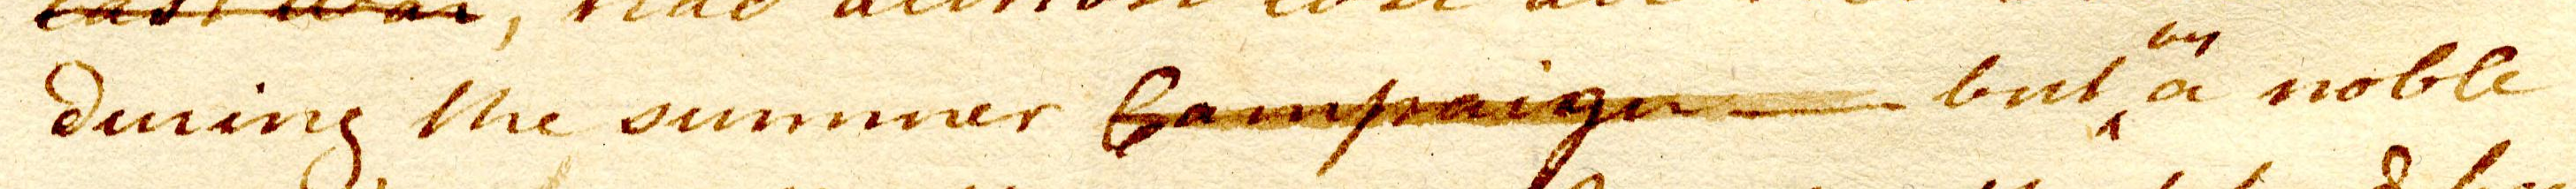during the summer [Campaign]- but ^ a noble
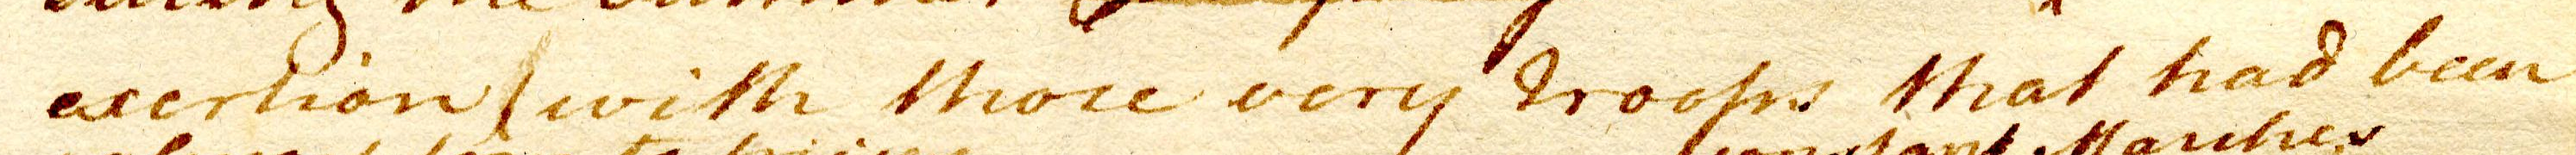exertion (with those very Troops that had been
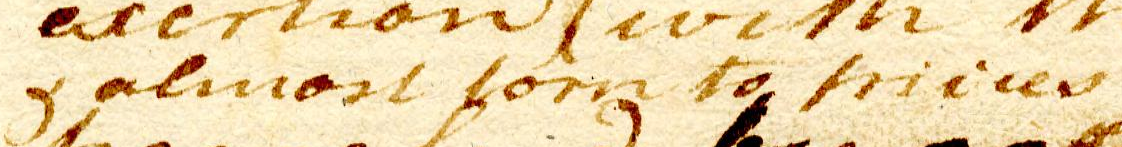& almost torn to pieces
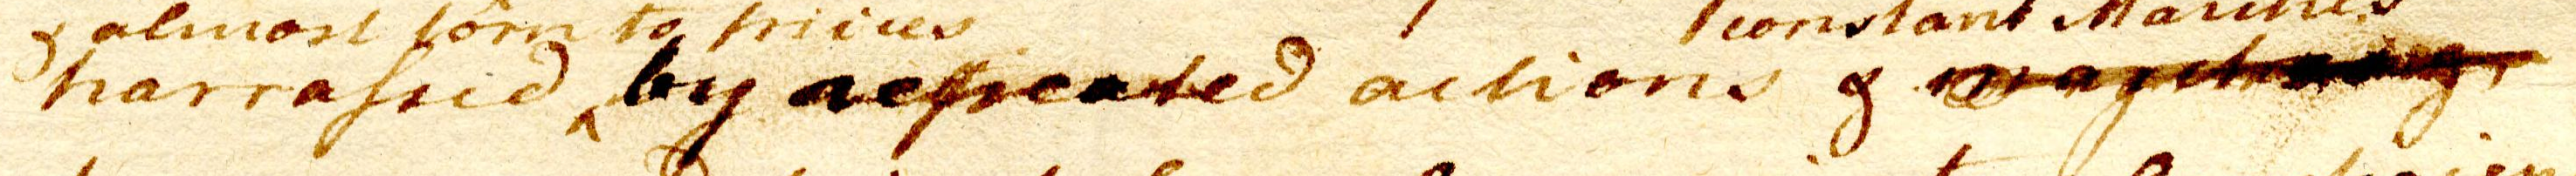harrassed ^ by acepted actions & [________]
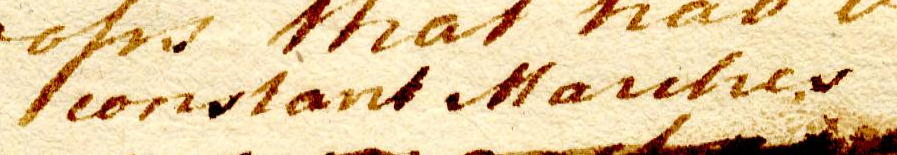constant Marches
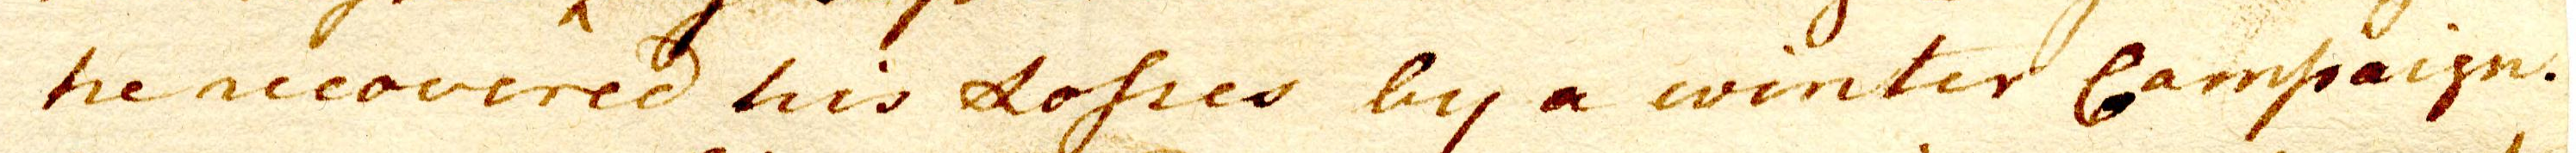he recovered his Losses by a winter Campaign.
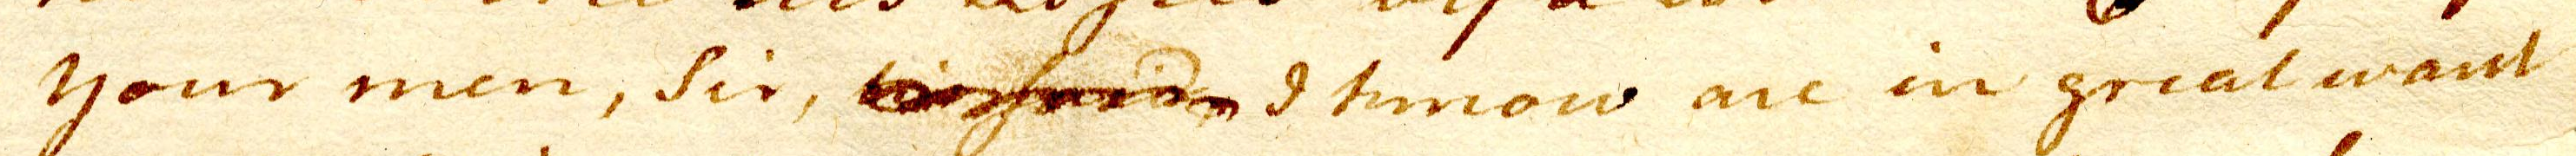Your men, Sir, [_______] I know are in great want
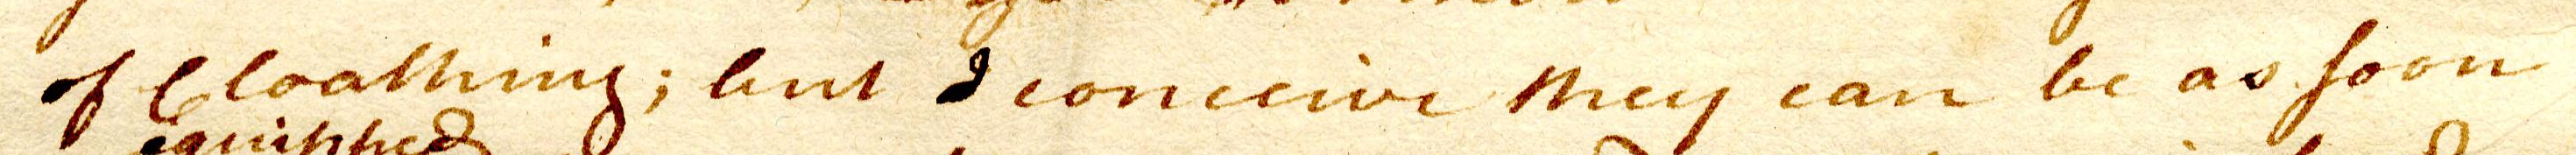of Cloathing; but I conceive they can be as soon
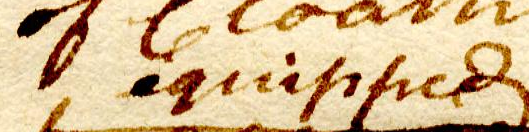equipped
